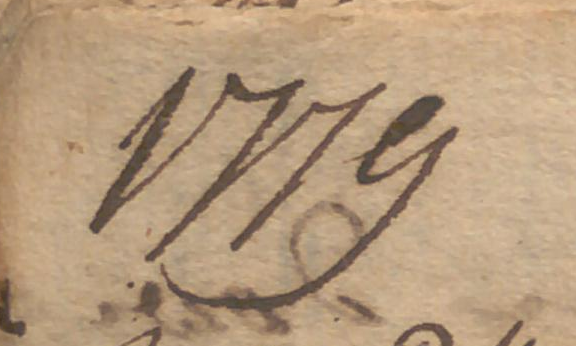1779
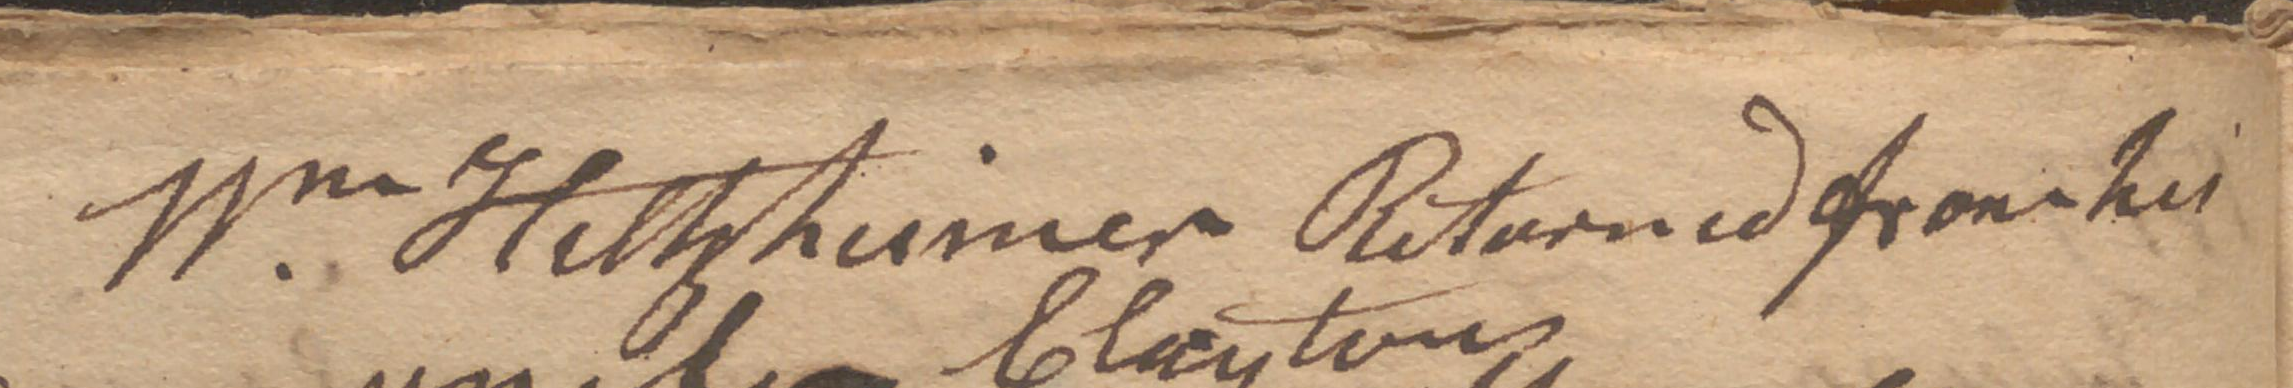W^m. Hiltzheimer Returned from his
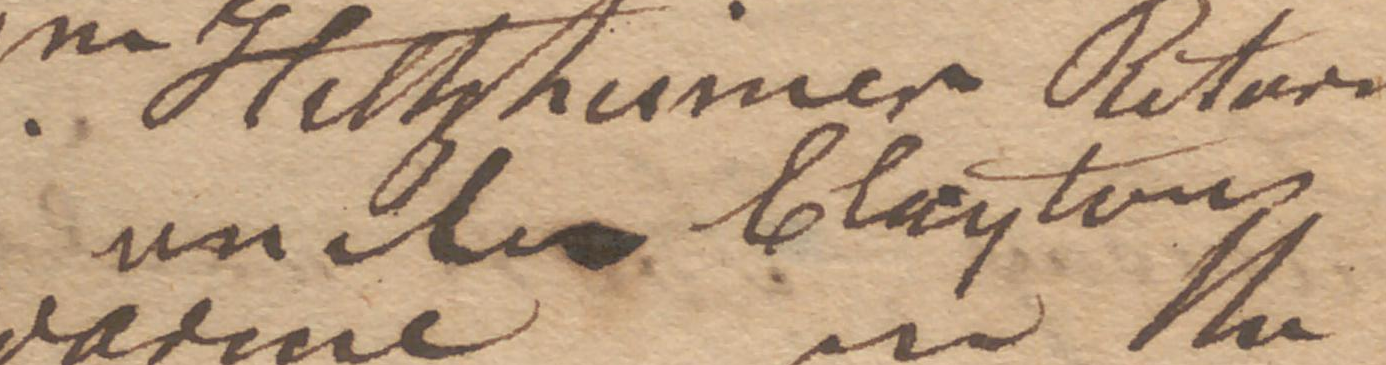uncle Claytons
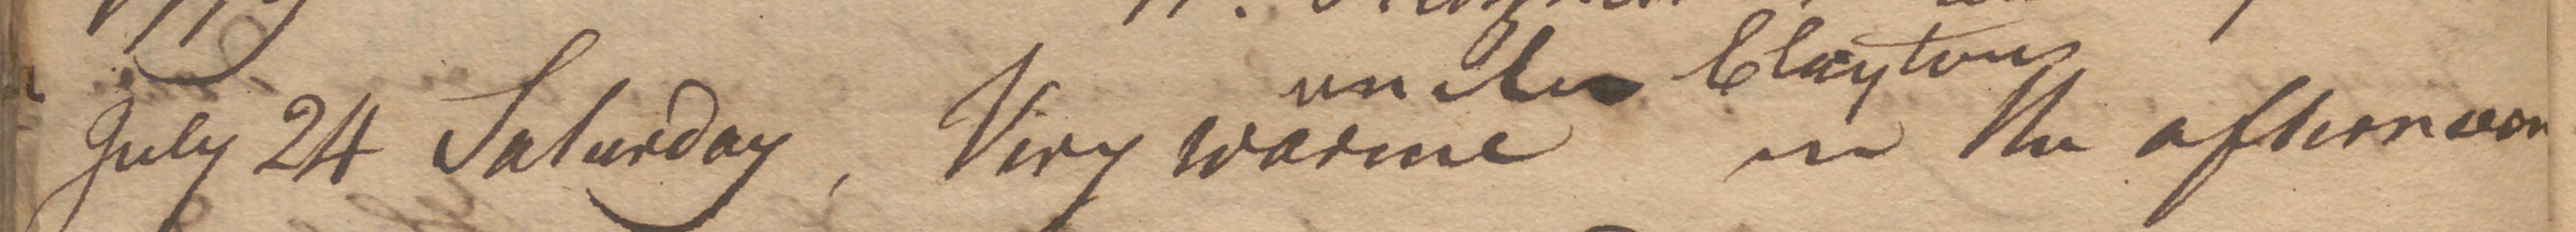July 24 Saturday. Very warme in the afternoon
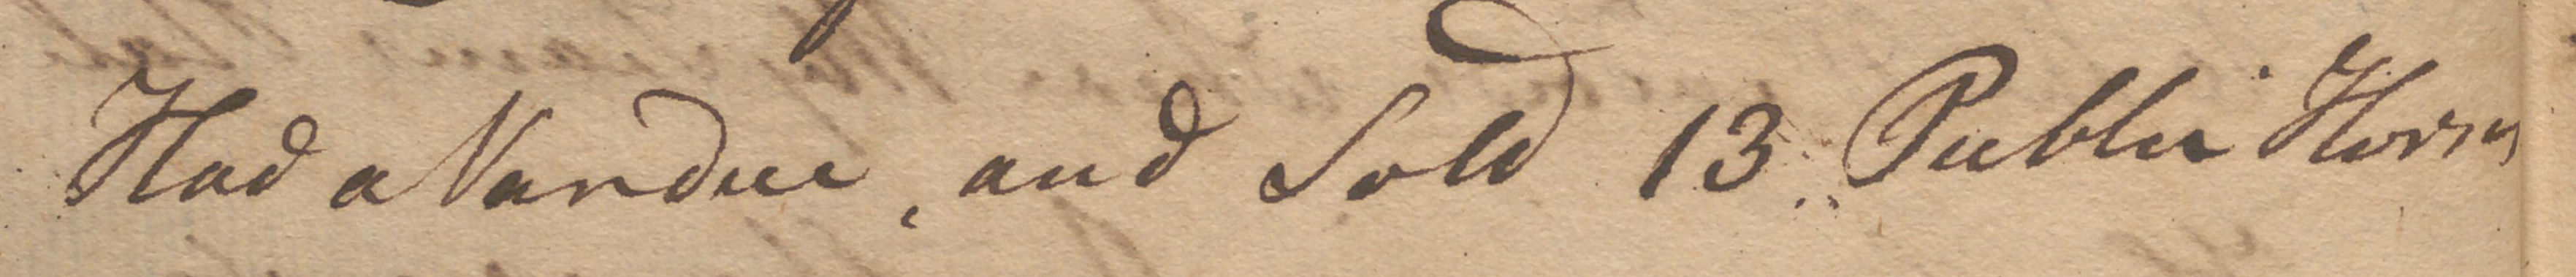Had a Vendue, and Sold 13 Public Horses
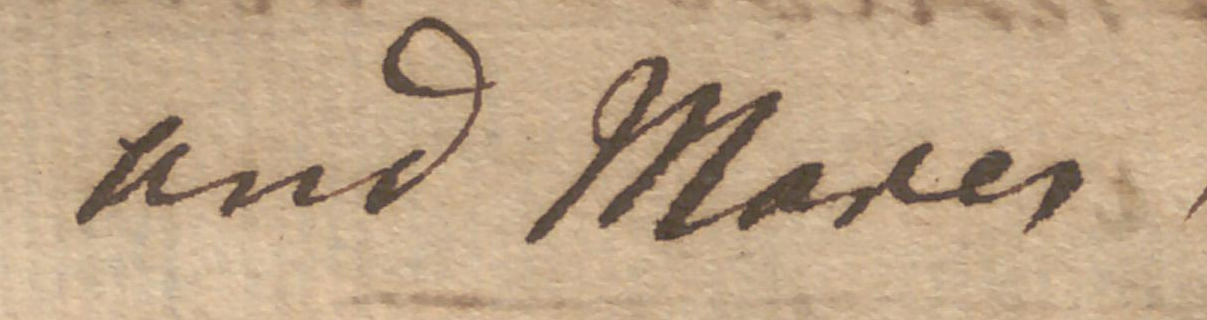and Mares
